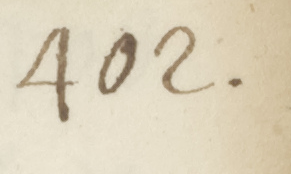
402.
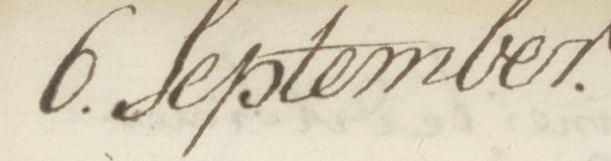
6. September.
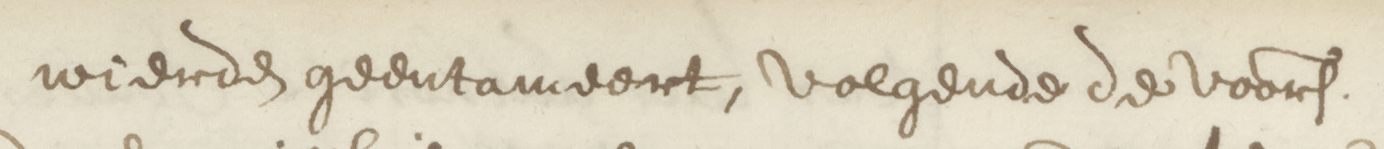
wierden geentameert, volgende de voors.
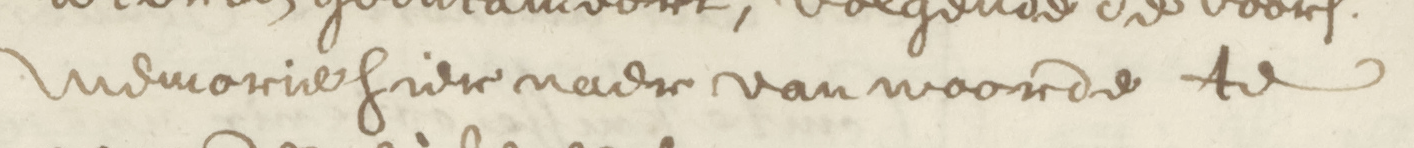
memorie hier naer van woorde te
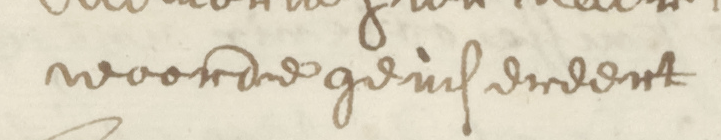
woorde geinsereert
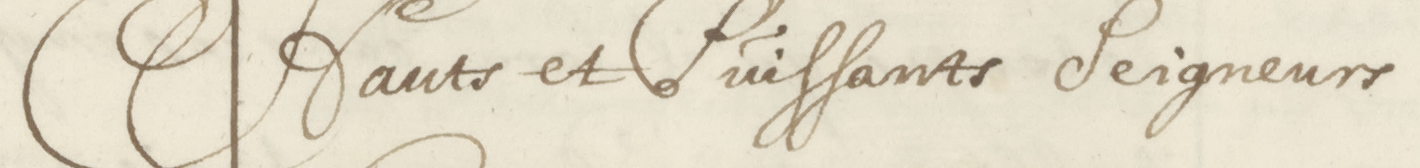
Hauts et Puissants Seigneur
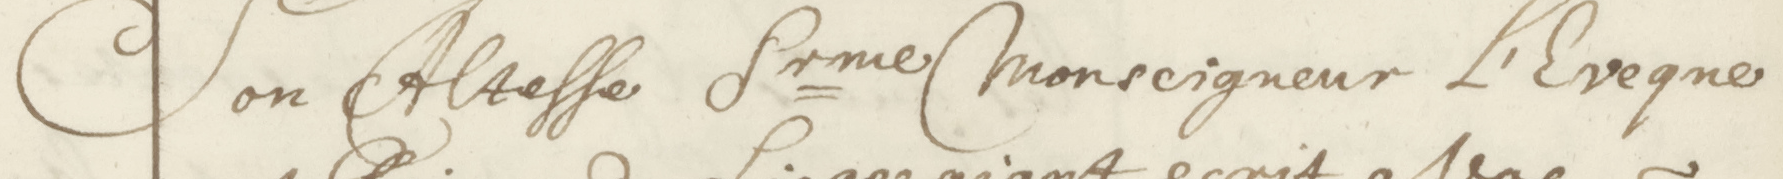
Son Altesse Srme Monseigneur L'Eveque
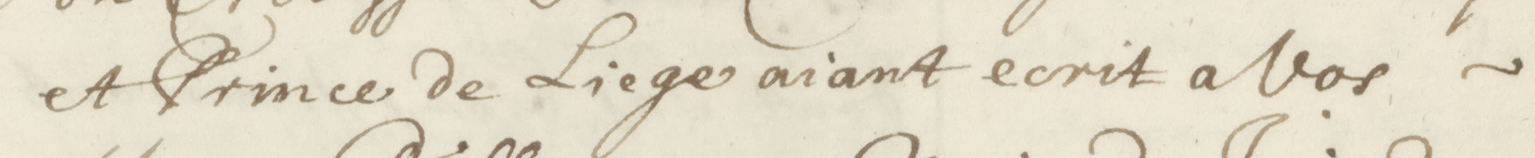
et Prince de Liege aiant ecrit avos
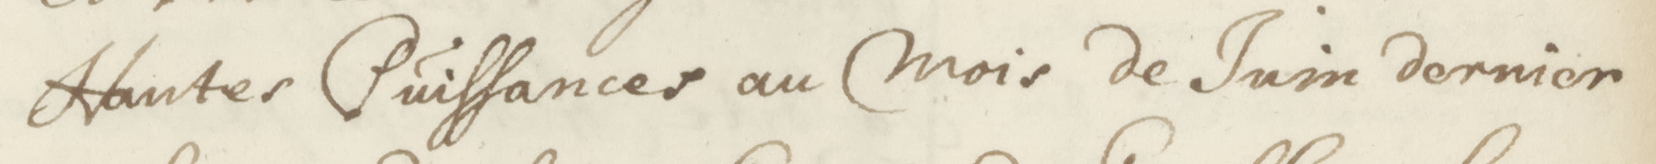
Hautes Puissances au mois de Juin dernier
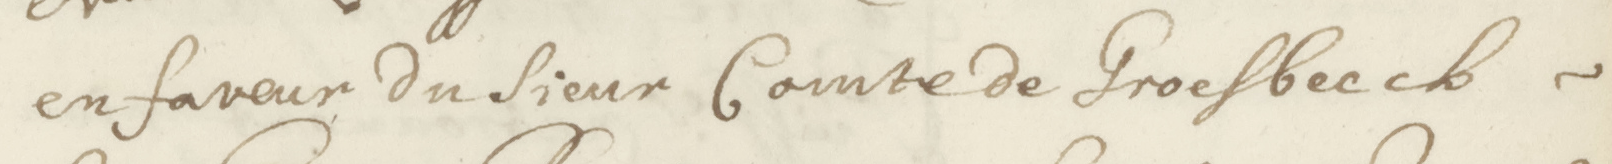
en faveur du sieur Comté de Groesbeeck
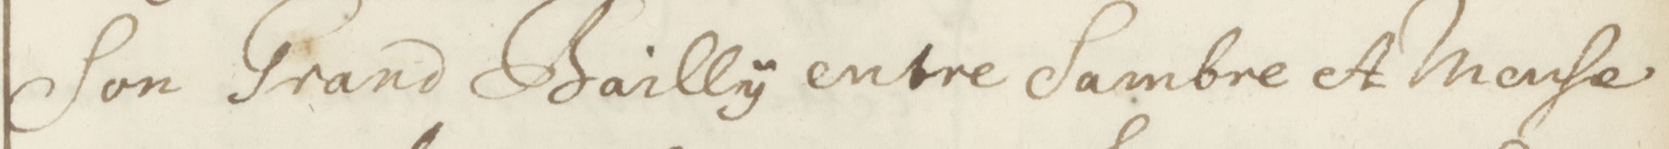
Son Grand Baillij entre Sambre A Meuse
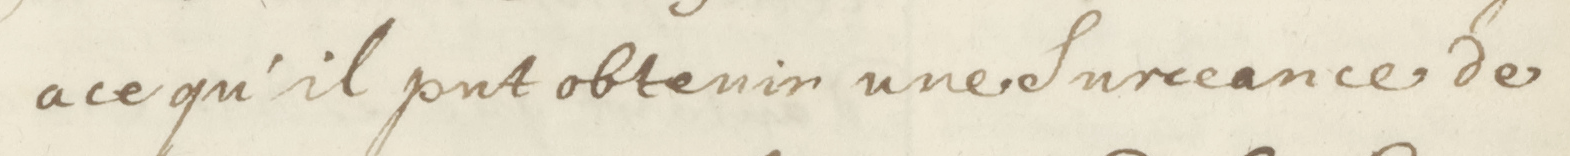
a ce qu'il put obtenir une surceance de
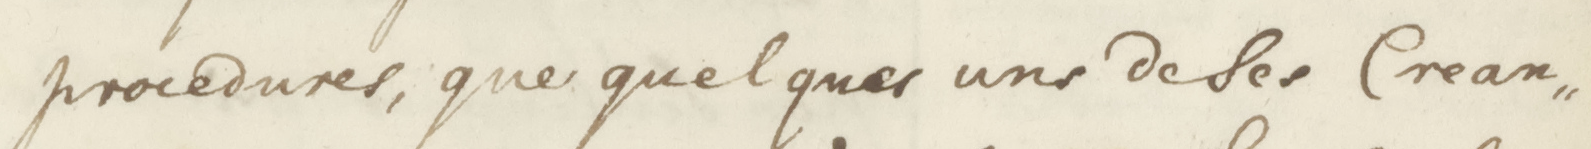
procedures, que quelques uns de ses Crean,,
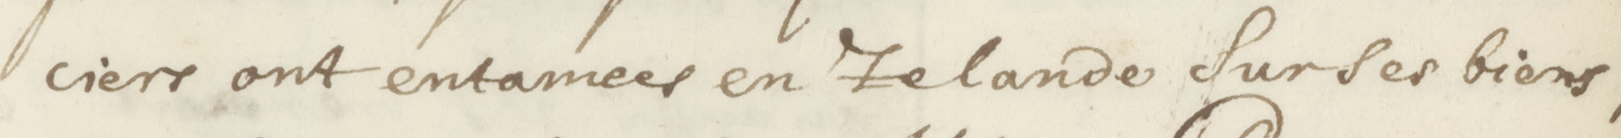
ciers ont entamees en Zelande sur ses biens
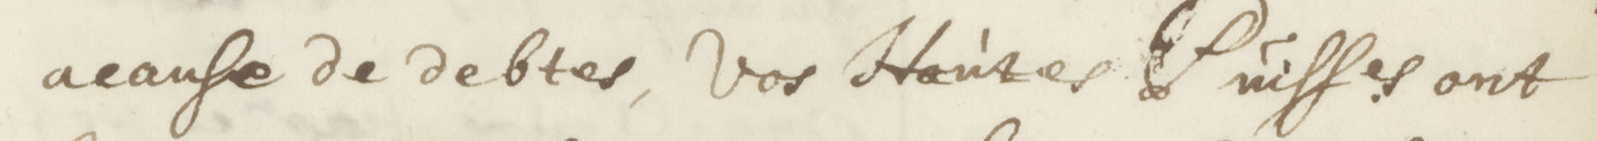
a cause de debtes, vos Haute Puisses ont
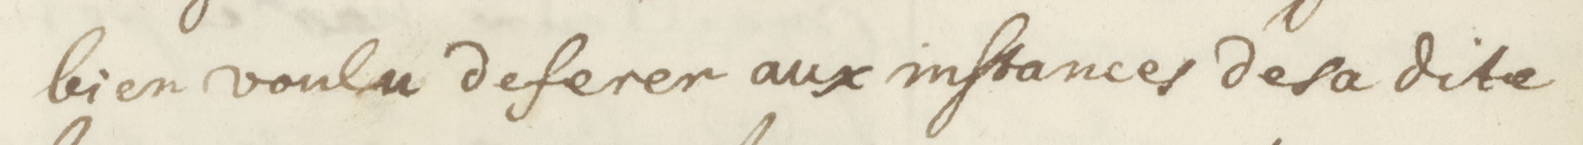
bien voulu deferer aux instance de sa dite
